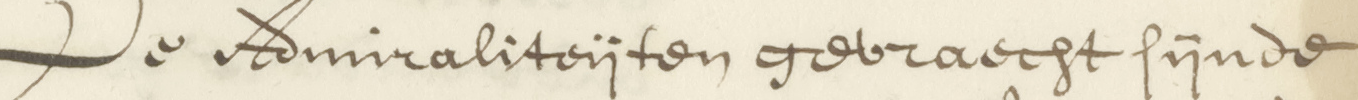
De Admiraliteijten gevraecht sijnde,
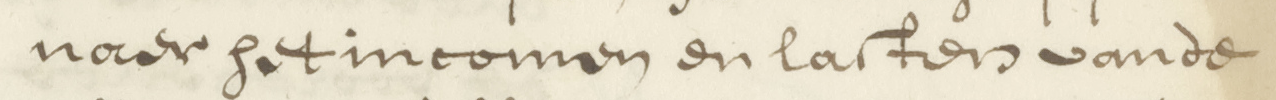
naer het incomen en lasten vande
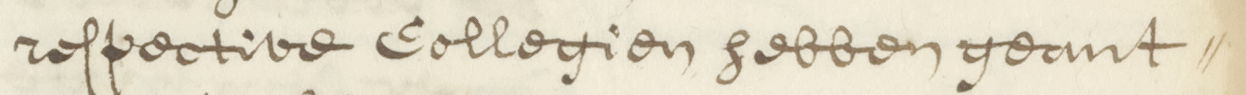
respective Collegien hebben geant„
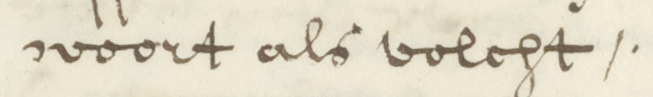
woort als volcht.
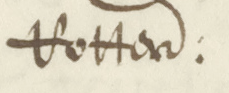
Rotterd:
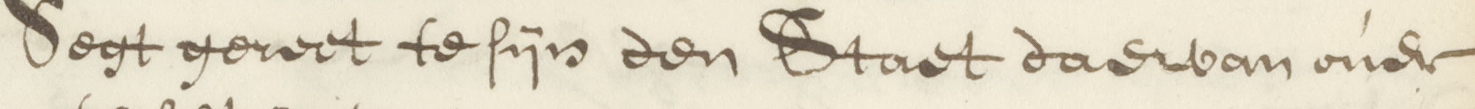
Segt gereet te sijn den Staet daervan ouer
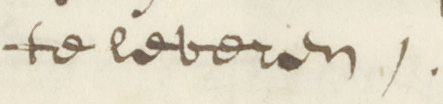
te leveren.
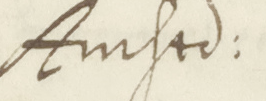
Amstd:
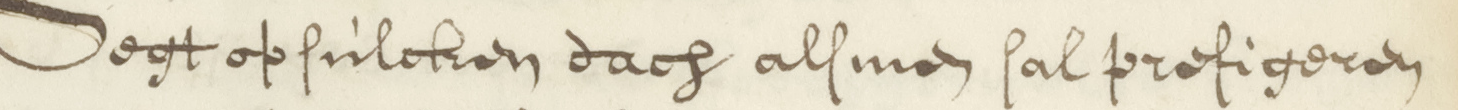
Segt op sulcken dach alsmen sal prefigeren
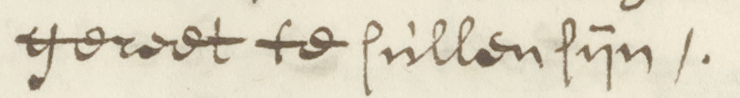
gereet te sullen sijn.
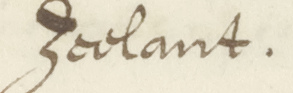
Zeelant.
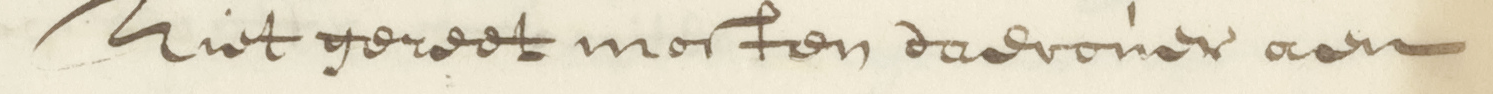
Niet gereet mosten daerouer aen
